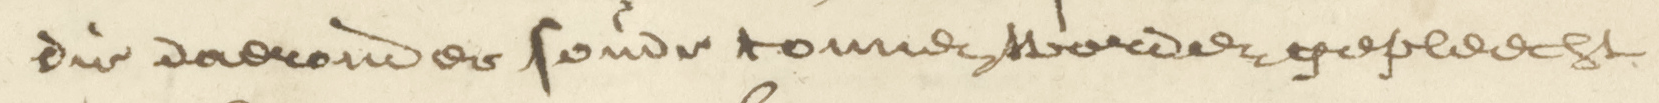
die daeronder soude connen worden gepleecht.
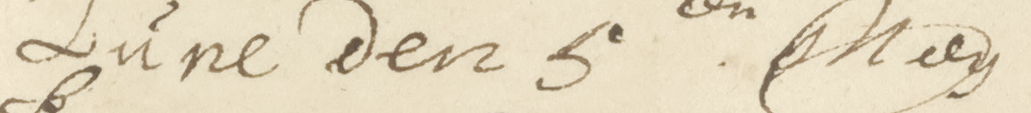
Lune den 5en. Mey
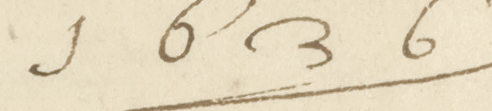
1636
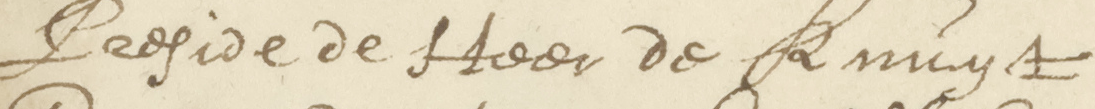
Preside de Heer de Knuyt
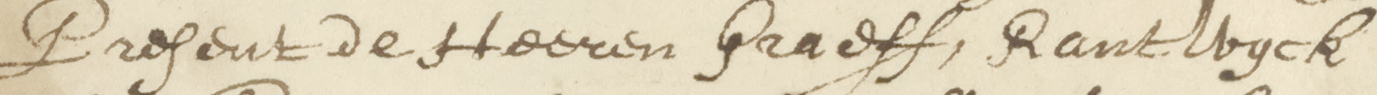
Present de Heeren Graeff, Rantwyck
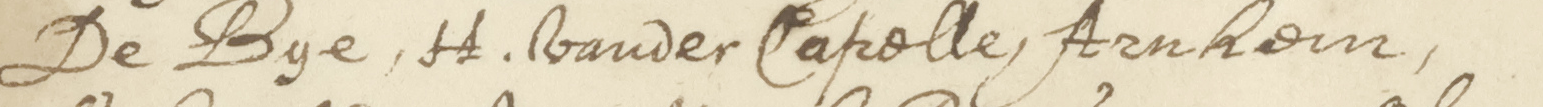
De Bye, H. vander Capelle, Arnhem,
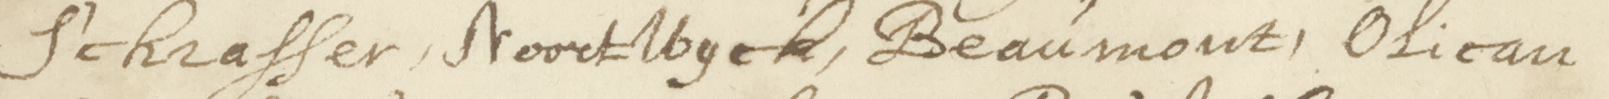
Schrasser, Noortwyck, Beaumont, Olican
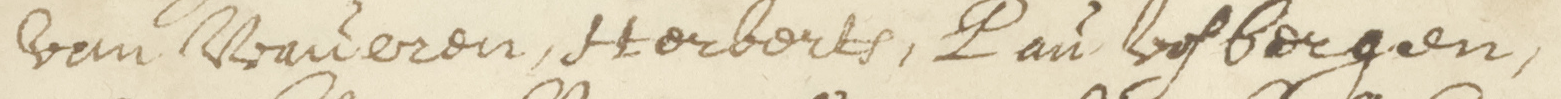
van Waueren, Herberts, Pau, Vosbergen,
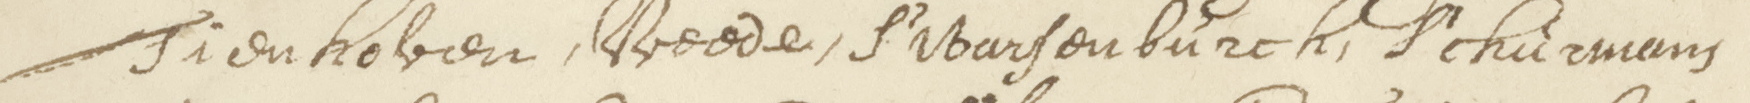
Tienhoven, Weede, Swarsenburch, Schurman,
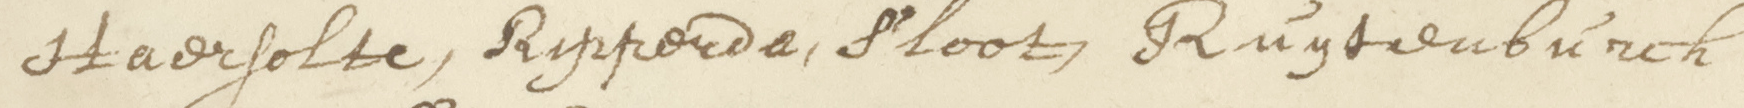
Haersolte, Ripperda, Sloot, Ruytenburch
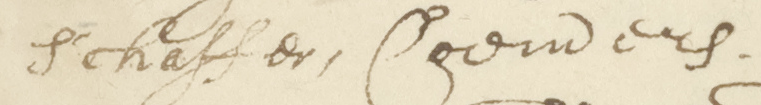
Schaffer, Coenders.
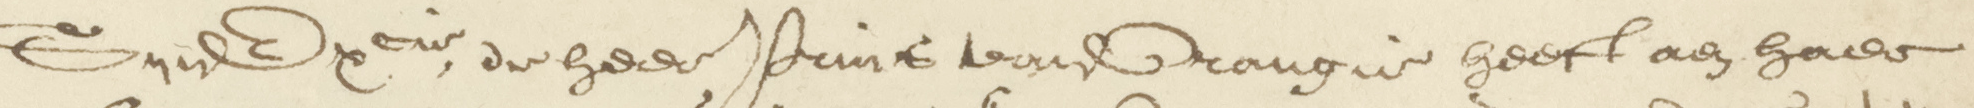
Syn Excie. de heer Prins van Orangie heeft aen haer
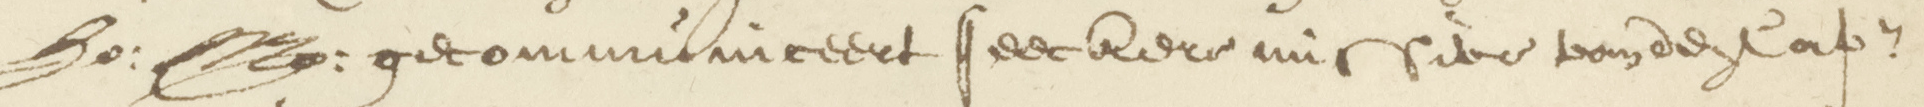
Ho:Mo: gecommuniceert seeckere missive van den Capn.
